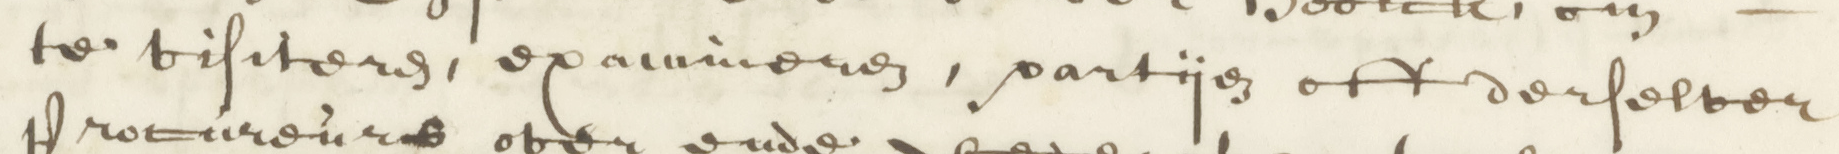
te visiteren, examineren, partijen off derselver
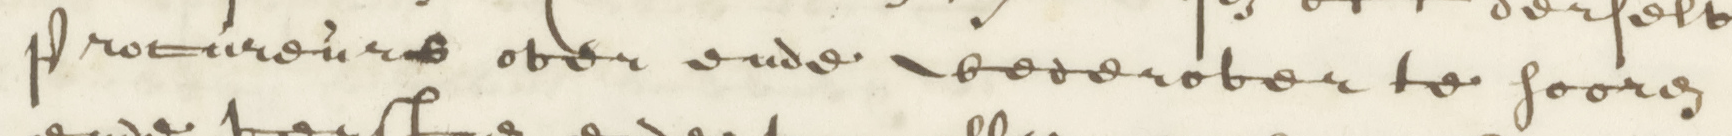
Procureurs over ende wederover te hooren
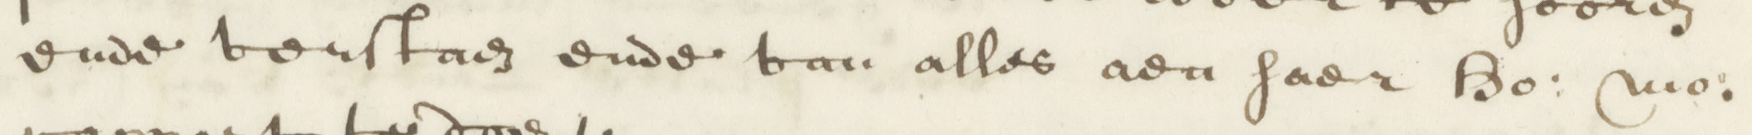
ende verstaen ende van alles aen haer Ho:Mo:
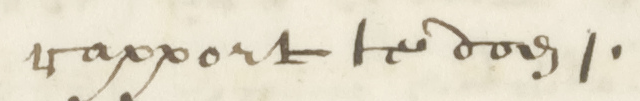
rapport te doen.
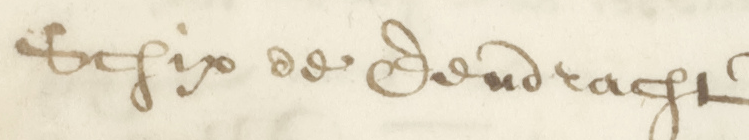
Schip de Eendracht
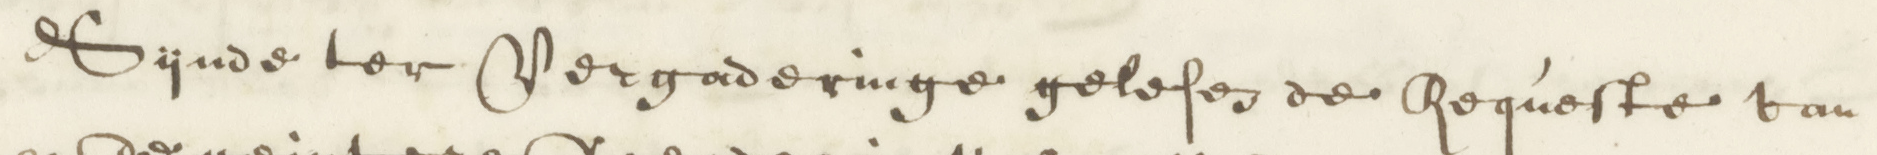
Sijnde ter Vergaderinge gelesen de Requeste van
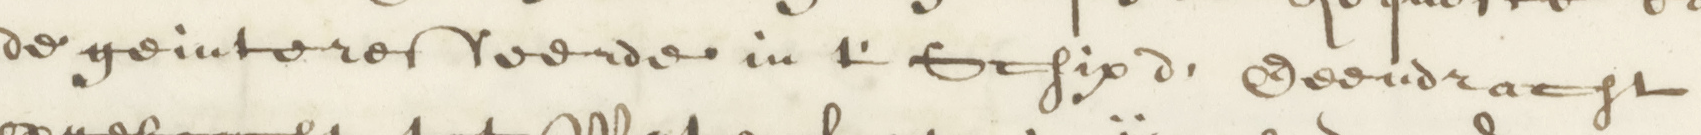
de geinteresseerde in t' Schip d'Eeendracht
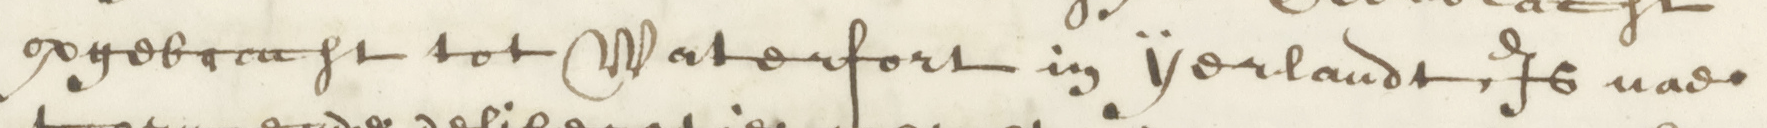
opgebracht tot Waterfort in IJerlandt, Is nae
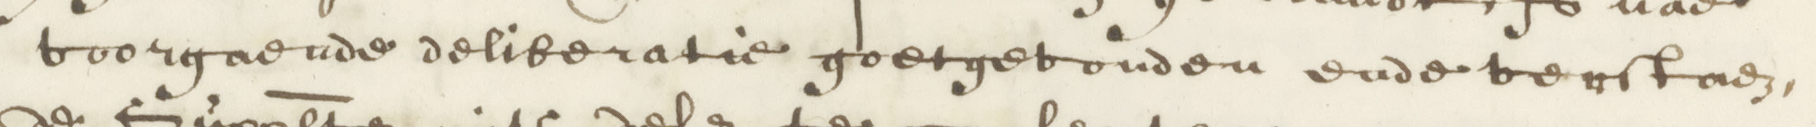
voorgaende deliberatie goetgevonden ende verstaen,
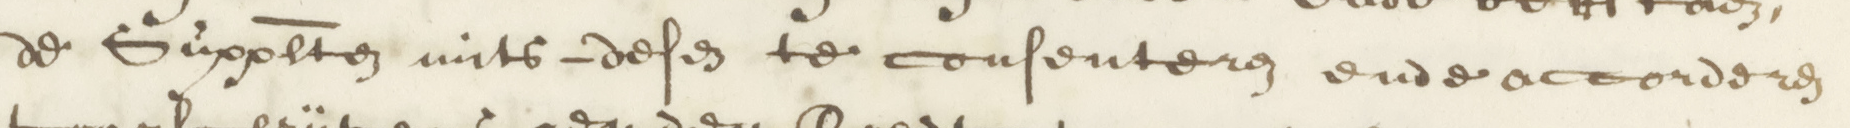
de Supplten mits-desen te consenteren ende accorderen
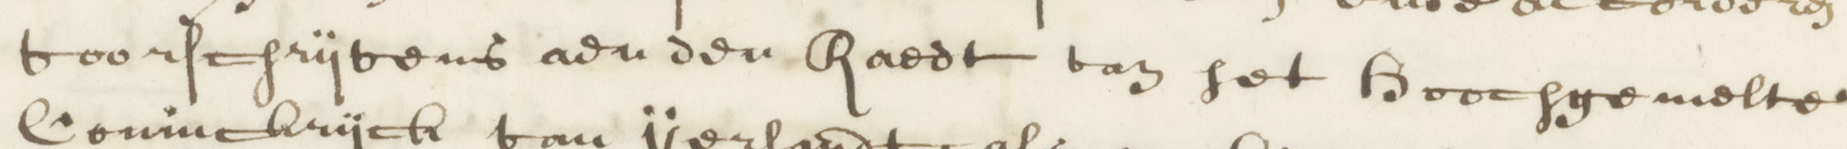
voorschrijvens aen den Raedt van het Hoochgemelte
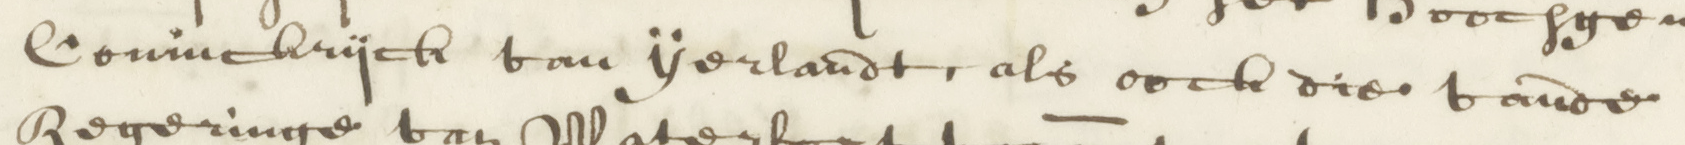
Coninckrijck van IJerlandt, als oock die vande
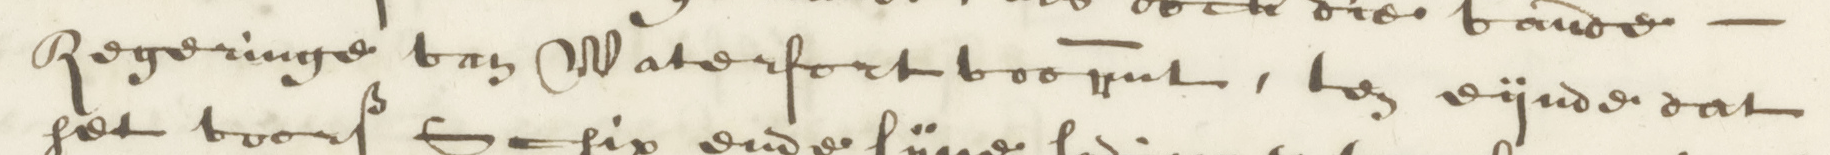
Regeringe van Waterfort voornt, ten eijnde dat
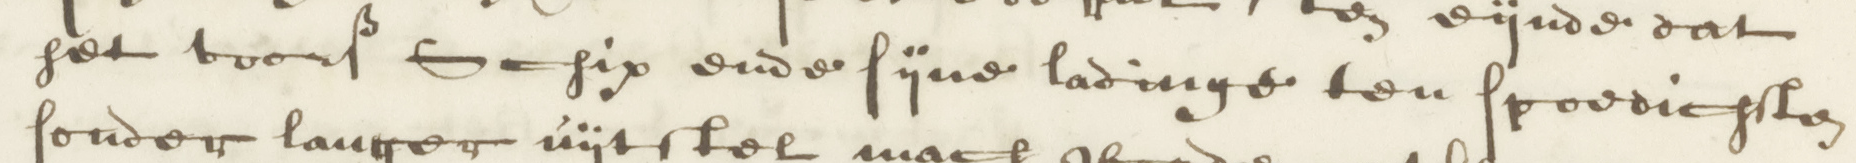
het voors Schip ende sijne ladinge ten spoedichsten
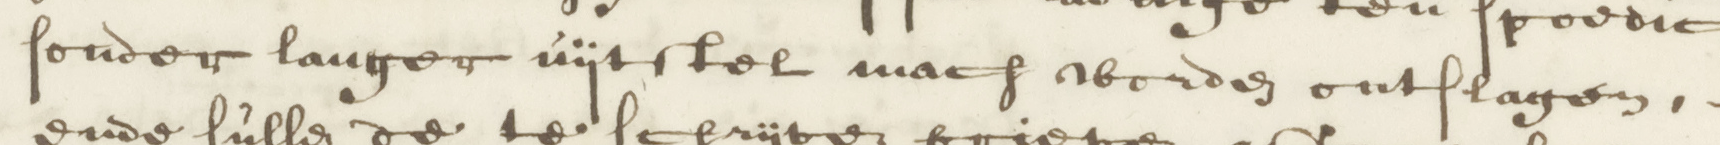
sonder langer uijtstel mach worden ontslagen,
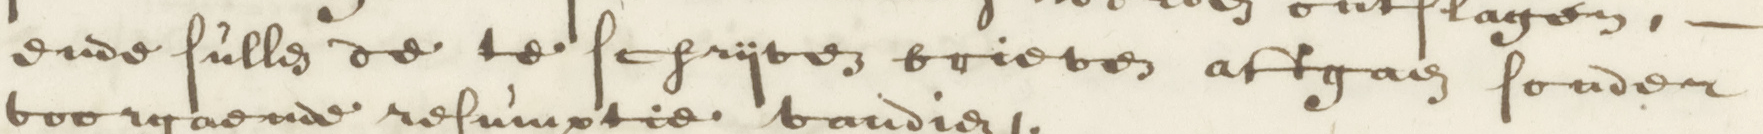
ende sullen de te schrijven brieven affgaen sonder
